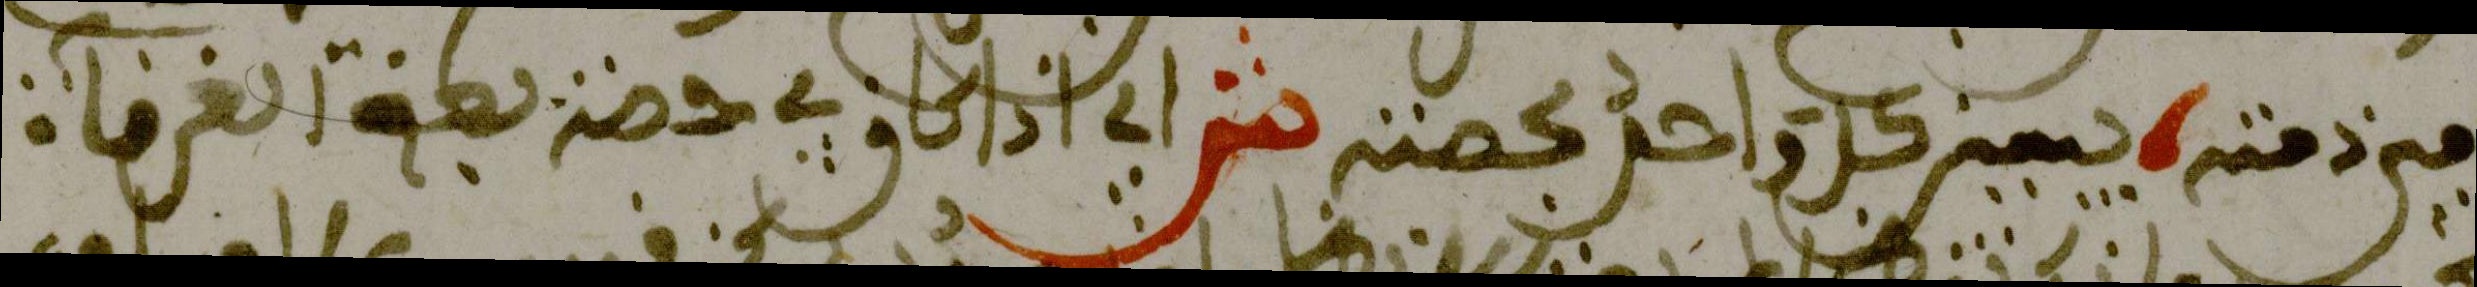في ذمته بين كل وَاحد بحصته ش اي اذا كان في حصة بعض الغرماء
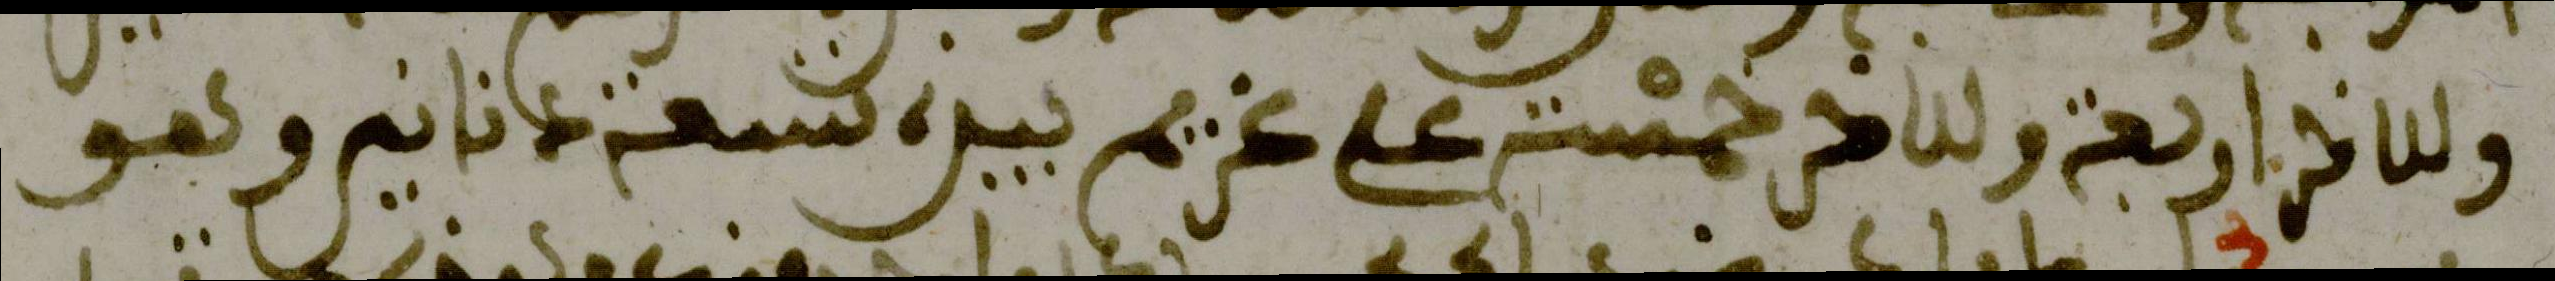وللاخر اربعة وللاخر خمسة على غريم بيده تسعة دنانير وهو
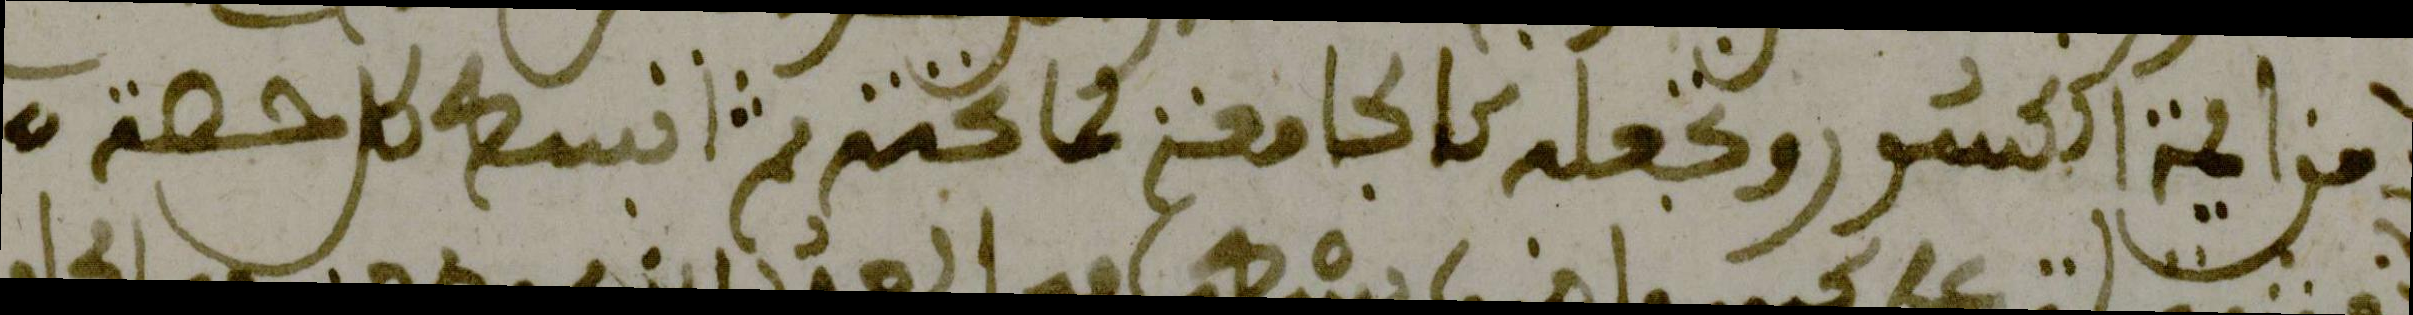من ايمة الكسور وتجعله كالجامعة لما تحته ثم ابسط كل حصة
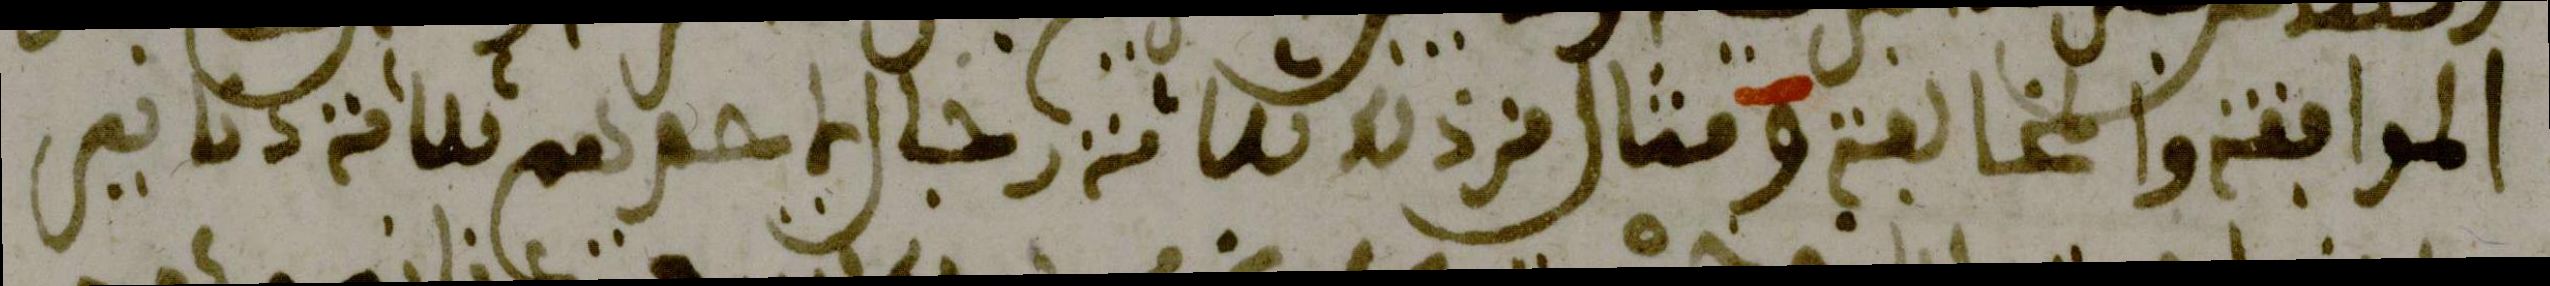الموافقة والمخالفة وَمثال ذلك ثلاثة رجال لاحدهم ثلاثة دنانير
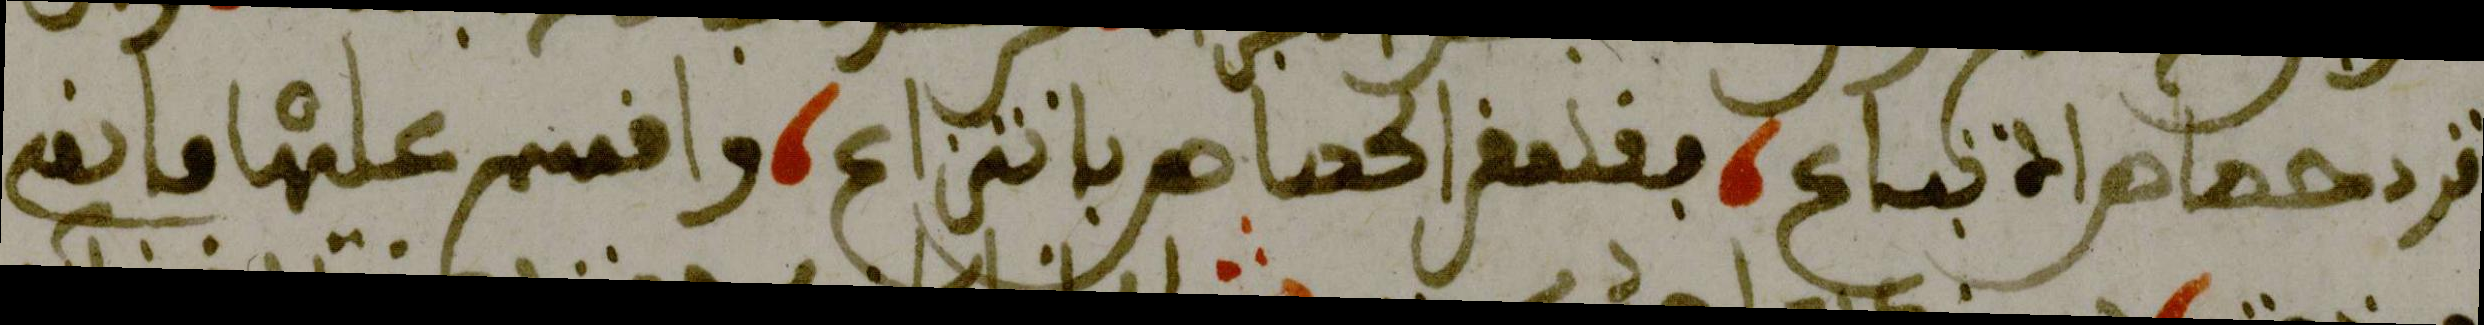ترد حصاص الاتباع فقهقر الحصاص بانتزاع واقسم عليْها ما بقي
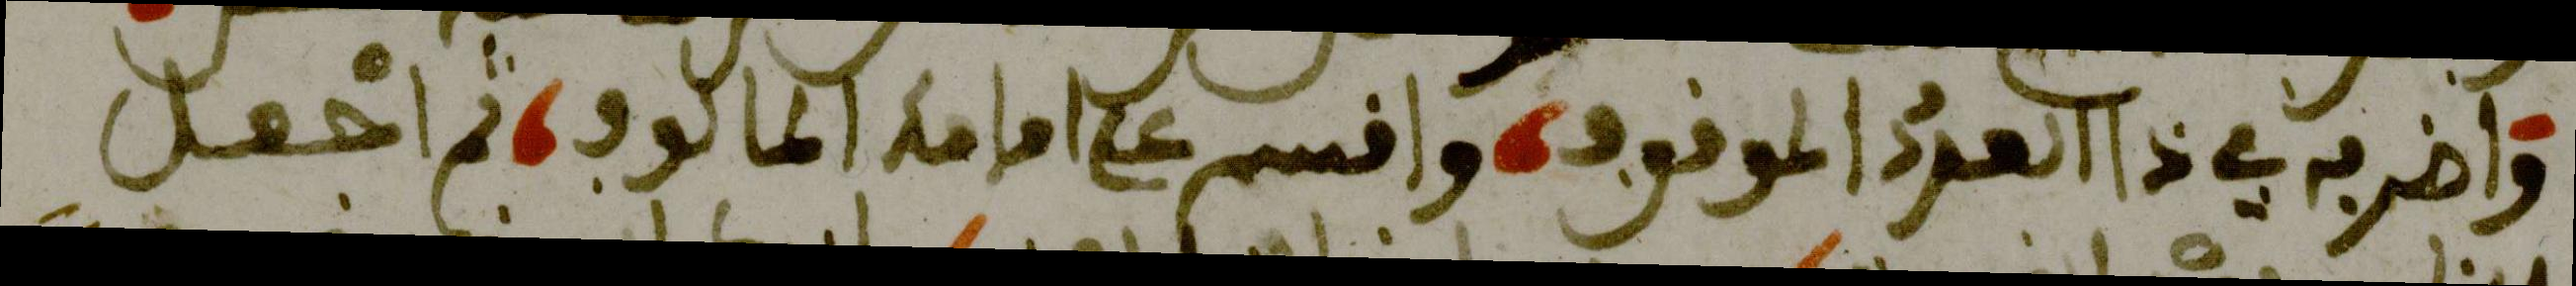وَاضربه في ذا العد الموقوف واقسم على امامك المالوف ثم اجعل
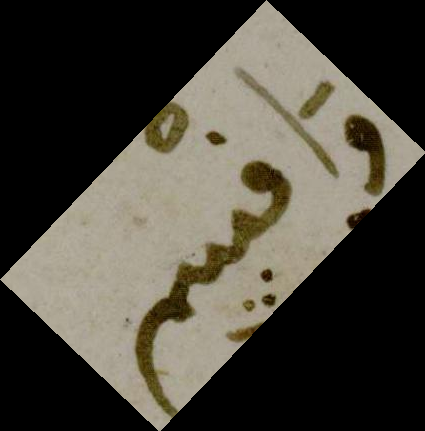وَاقْسم
